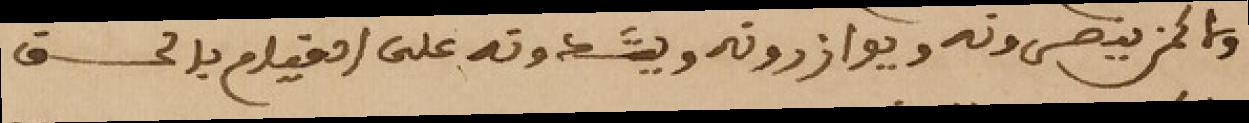ولا كمن ينصرونه ويوازرونه ويشدونه على القيام بالحق
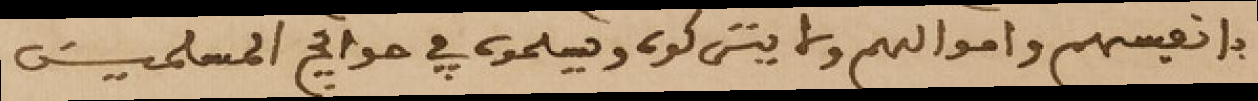بانفسهم واموالهم ولا يتركوه ويسلموه في حوائج المسلمين
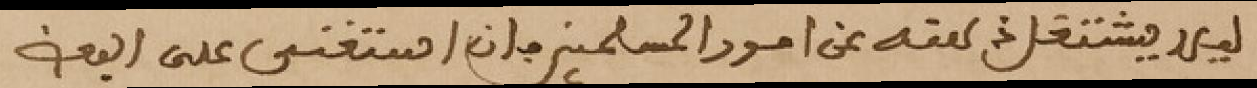ليلا يشتغل ذهنه عن امور المسلمين فان استغنى على البعض
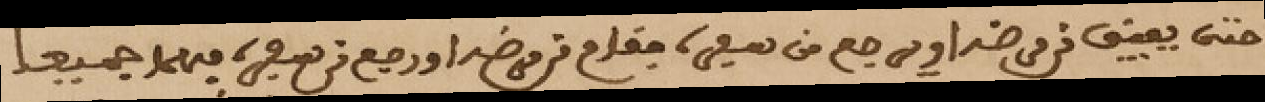حتى يفيق من مرضه او يرجع من سفره فقام من مرضه او رجع من سفره فيهما جميعا
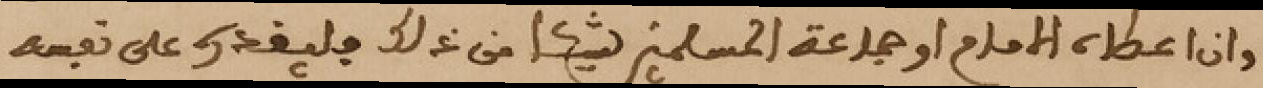وان اعطاه الامام او جماعة المسلمين شيئا من ذلك فليقدره على نفسه
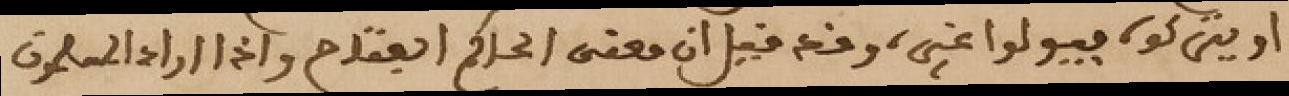او يتركوه فيولوا غيره وقد قيل ان معنى الحاكم الفتاح واذا اراد المسلمون
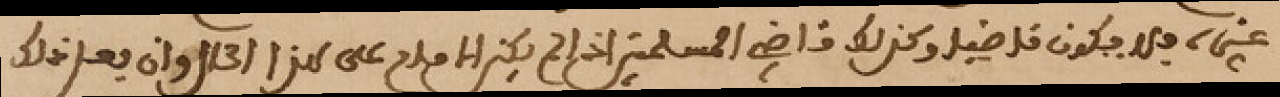غيره فلا يكون قاضيا وكذلك قاضي المسلمين اذا لم يكن الامام على هذا الحال وان فعل ذلك
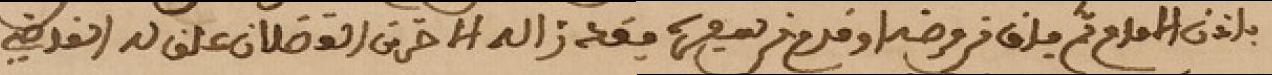باذن الامام ثم فان من مرضه او قدم من سفره فقد زاله الاخر من القضا لان علن له القاضي
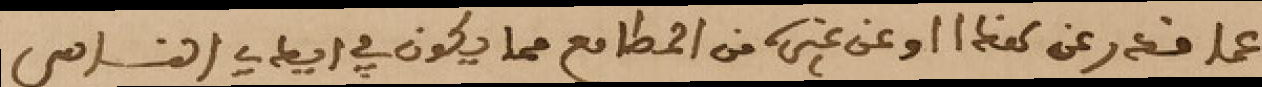عما قدر عن هذا او عن غيره من المطامع مما يكون في ايدي الناس
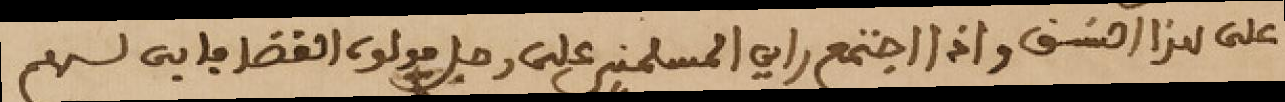على هذا النسق واذا اجتمع راي المسلمين على رجل فولوه القضا فابى لهم
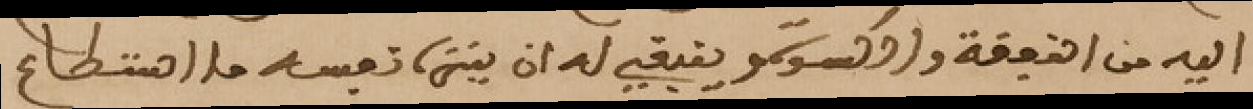اليه من النفقة والكسوة ينبغي له ان ينزه نفسه ما استطاع
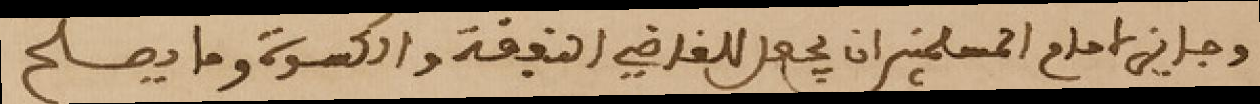وجايز لامام المسلمين ان يجعل للقاضي النفقة والكسوة وما يصلح
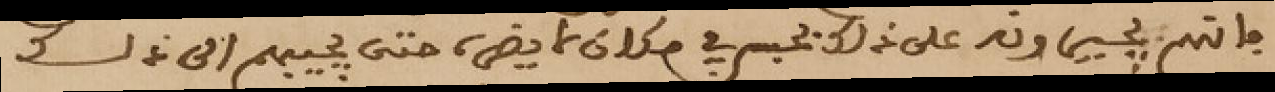فانهم يجيرونه على ذلك بحبس في مكان لا يضره حتى يجيبهم الى ذلك
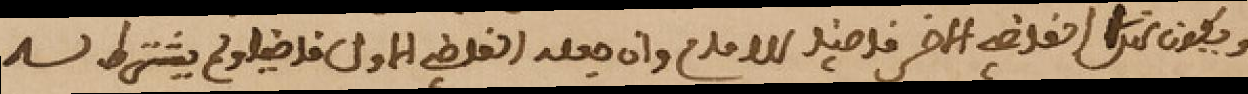ويكون هذا القاضي الاخر قاضيا للامام وان جعله القاضي الاول قاضيا ولم يشترط له
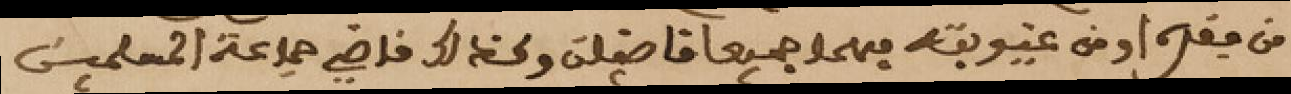من فقده او من غيبوبته فهما جميعا قاضيان وكذلك قاضي جماعة المسلمين
